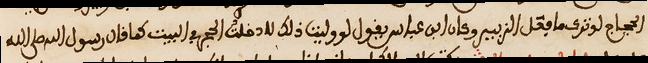الحجاج لو ترك ما فعل الزبير وكان ابن عباس يقول لو وليت ذلك لادخلت الحجر في البيت كما قال رسول الله صلى الله
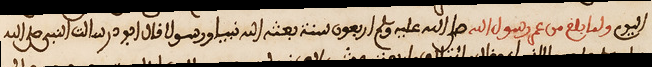اليوم ولما بلغ من عمر رسول الله صلى الله عليه وسلم اربعون سنة بعثه الله نبيا ورسولا قال ابو درسالت النبى صلى الله
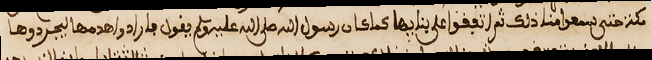مكة حتى سمعوا منا ذلك ثم تفقوا على بنايها كما كان رسول الله صلى الله عليه وسلم يقول فارادوا هدمها ليجردوها
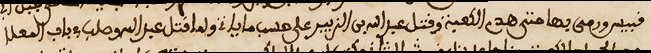قبيس ورمى بها حتى هدم الكعبة وقتل عبد الله بن الزبير على حسب ماياتى ولما قتل عبد الله وصلب في باب المعلا
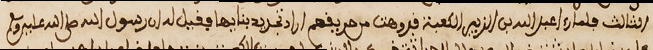الثالث فلما رءا عبد الله بن الزبير الكعبة قد وهت من حريقهم اراد تجريد بنايها فقيل له ان رسول الله صلى الله عليه وسلم
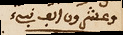وعشرون الف نبىء
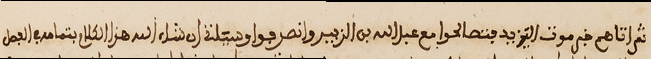ثم اتاهم خبر موت اليزيد فتصالحوا مع عبد الله بن الزبير وانصرفوا وسيلة ان شاء الله هذا الكلام بتمامه في الفصل
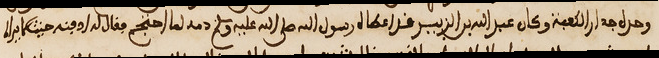وحده جدار الكعبة وكان عبد الله بن الزبير قد اعطاه رسول الله صلى الله عليه وسلم دمه لما احتجم فقال له ادفنه حيث لايراه
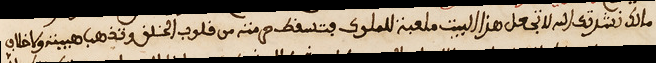مالك نشدتك الله لا تجعل هذا البيت ملعبة للملوك فتسقط حرمته من قلوب الخاق وتذهب هيبته ولاخلاف
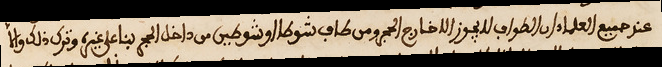عند جميع العلماء ان الطواف لا يجوز الاخارج الحجر ومن طاف شوطا او شوطين من داخل الحجر بنا على غيره وترك ذلك والا
